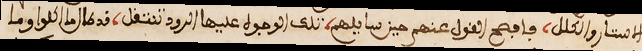الاستار والكلل فافصح القول عنهم حين سايلهم تلك الوجوه عليها الدود تنتقل قد طال ما اكلوا وما
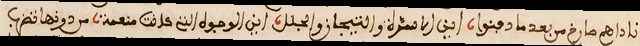ناداهم صارخ من بعد ما دفنوا اين الاسرة والتيجان والجلل اين الوجوه التي كانت منعمة من دونها تضرب
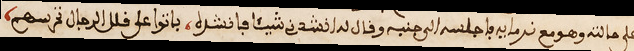على حالته وهو مع ندمايه فاجلسه الى جنبه وقال له انشدنى شيئا فانشده باتوا على قلل الرجال تحرسهم
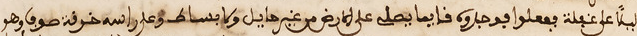ليلا على غفلة ففعلوا فوجدوه قايما يصلى على الارض من غير حايل ولا بساط وعلى راسه خرقة صوف وهو
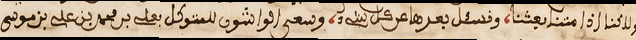ولاكنا اذا متنا بعثنا ونسئل بعدها عن كل شىء وسعى الواشون للمتوكل بعلى بن محمد بن على بن موسى
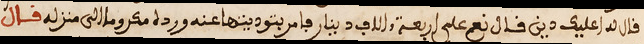قال له اعليك دين قال نعم على اربعة والاف دينار فامر بتوديتها عنه ورده مكر وما الى منزله قال
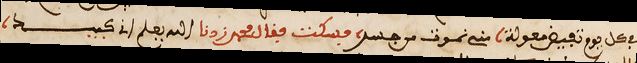في كل يوم تفيض معولة منى نموت من جسده فسكت فقال محمد زدنا الله يعلم انى كمد
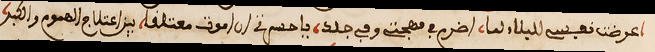عرضت نفسى للبلاء لما اضرم في مهجتى وفي جلد ياحسرتىي ان اموت معتلقا بين اعتلاج الهموم والكبد
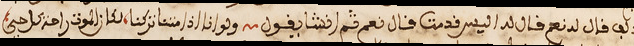دلف قال له نعم قال له اليس قدمت قال نعم ثم انشا بقول ولو انا اذا متنا تركنا لكان الموت راحة كل حي
